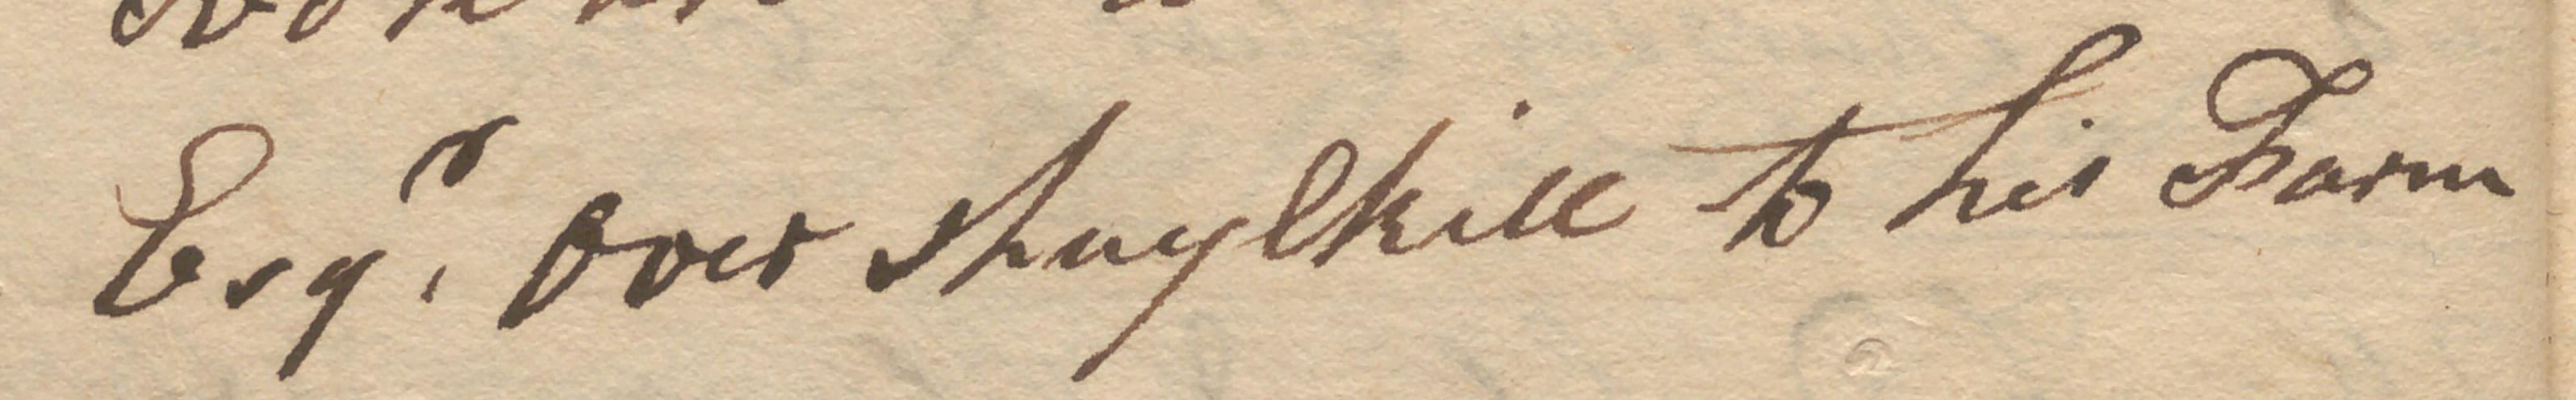Esq^r. over shuylkill to his Farm
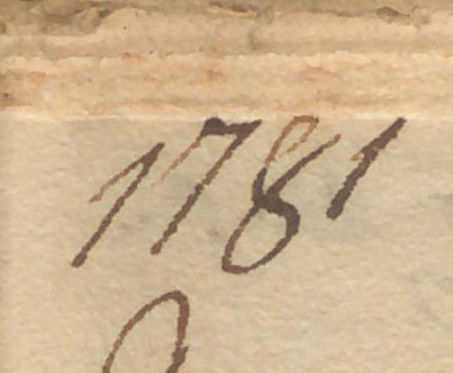1781
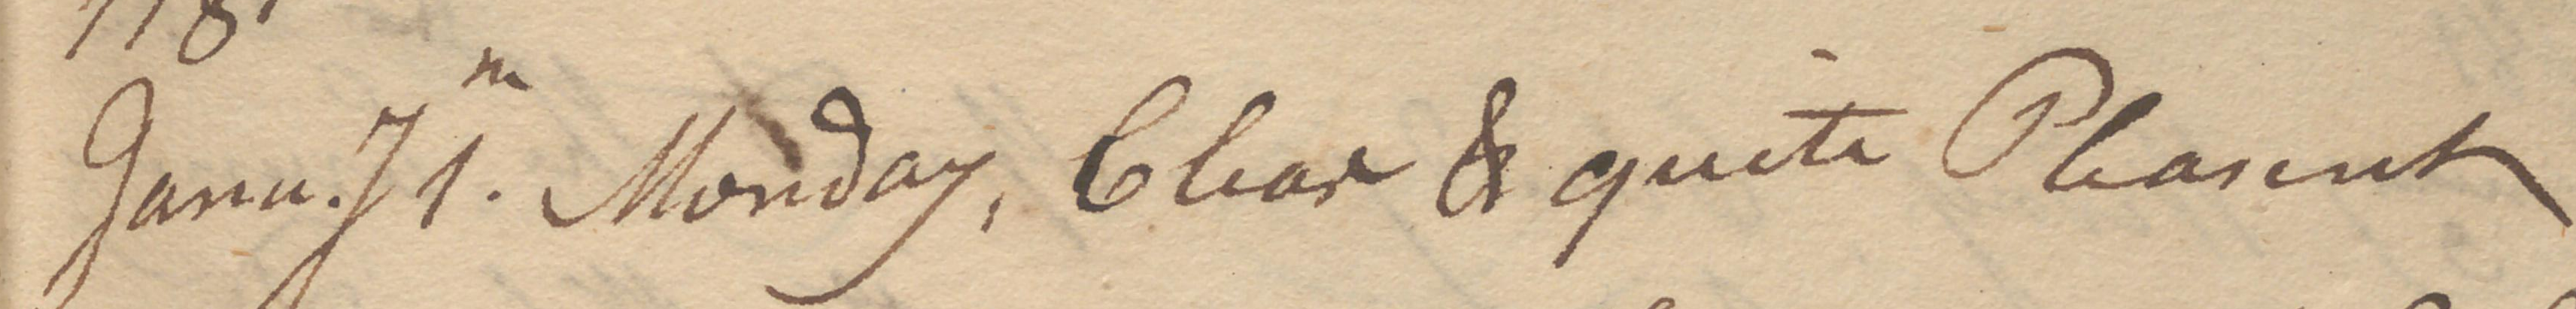Janu^y. 1^th. Monday, Clear & quite Pleasent
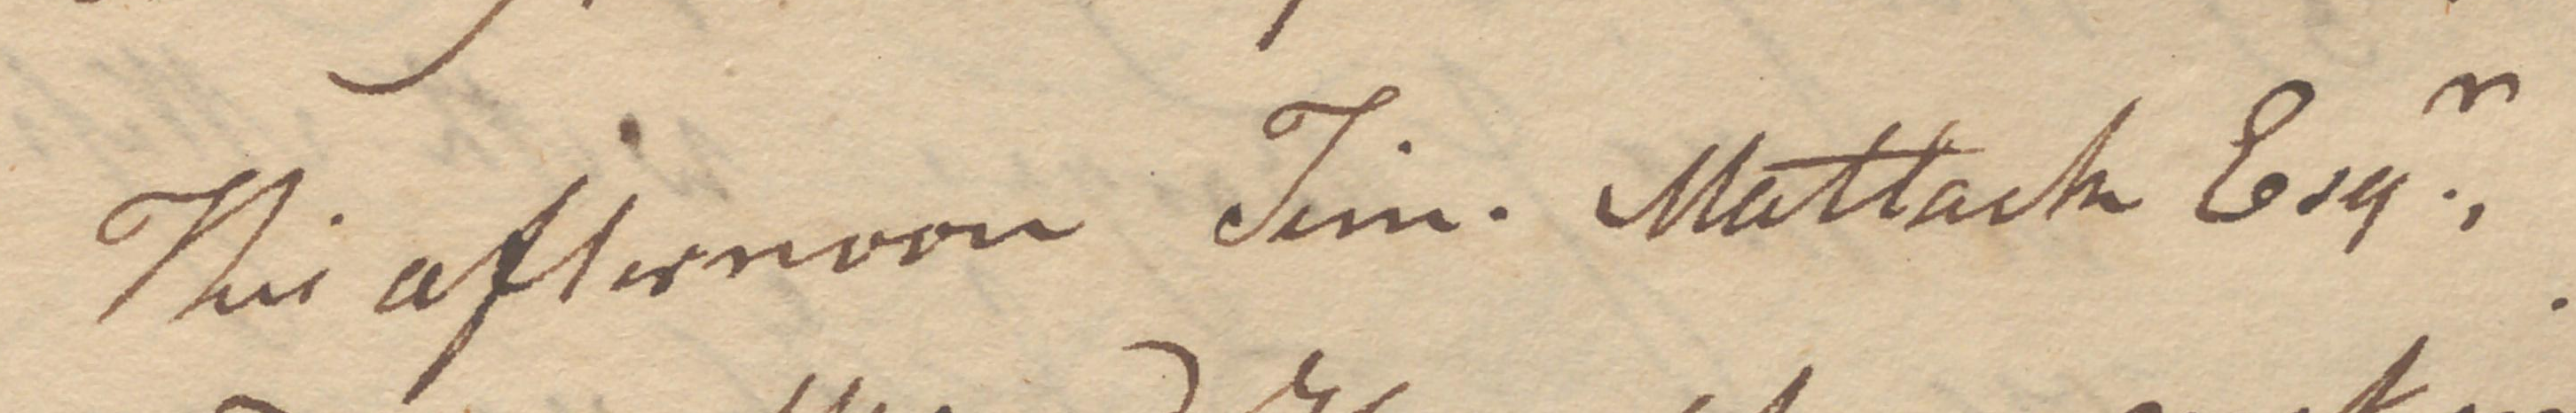This afternoon Tim. Mattack Esq^r.
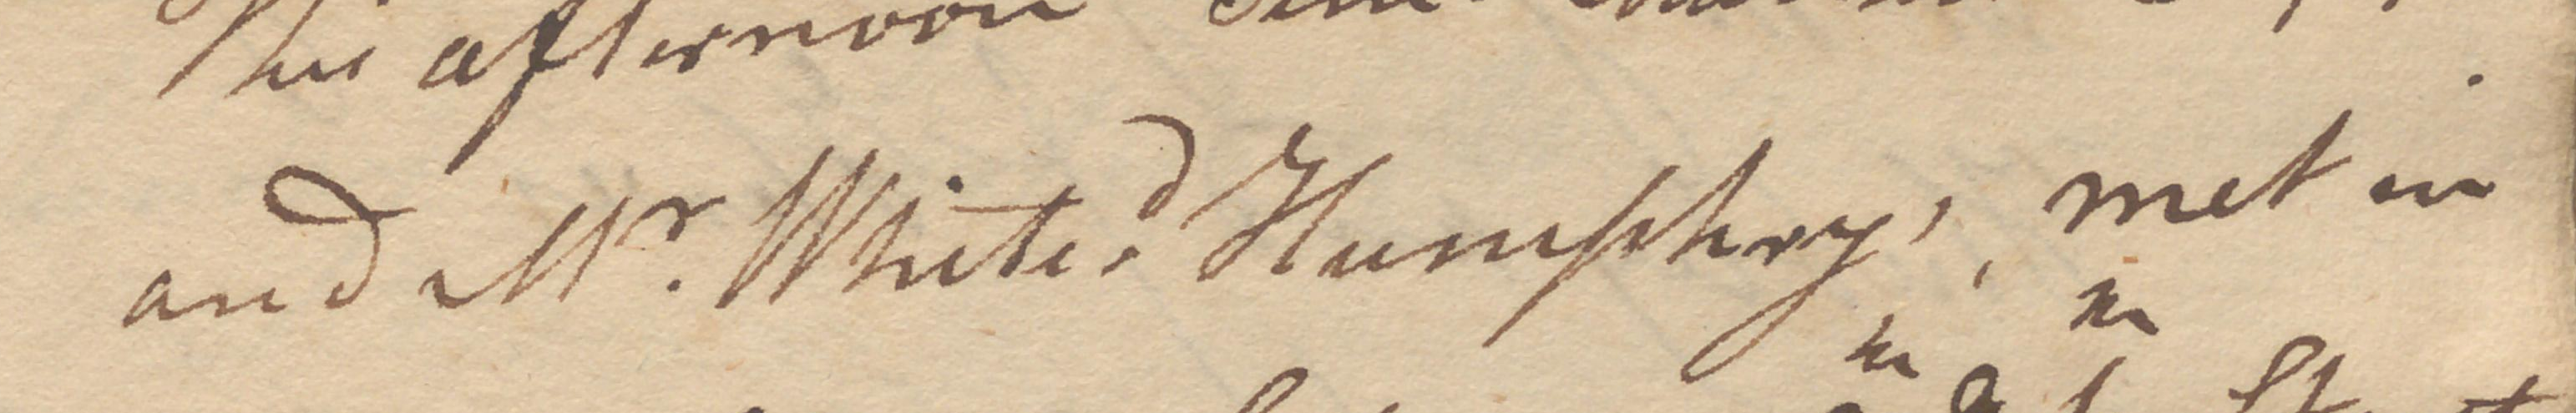and M^r. White^d. Humphrys met in
